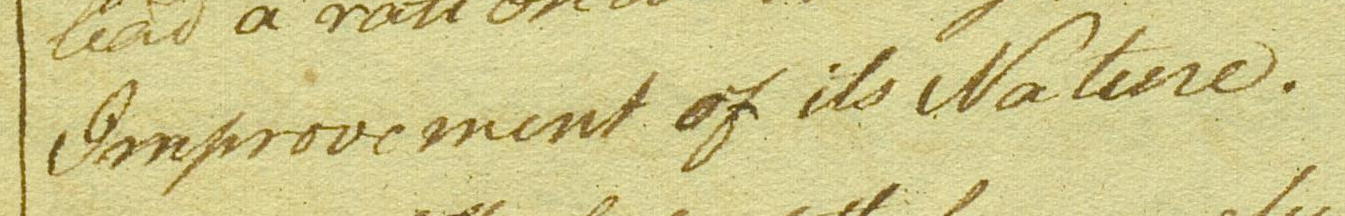Improvement of its Nature.
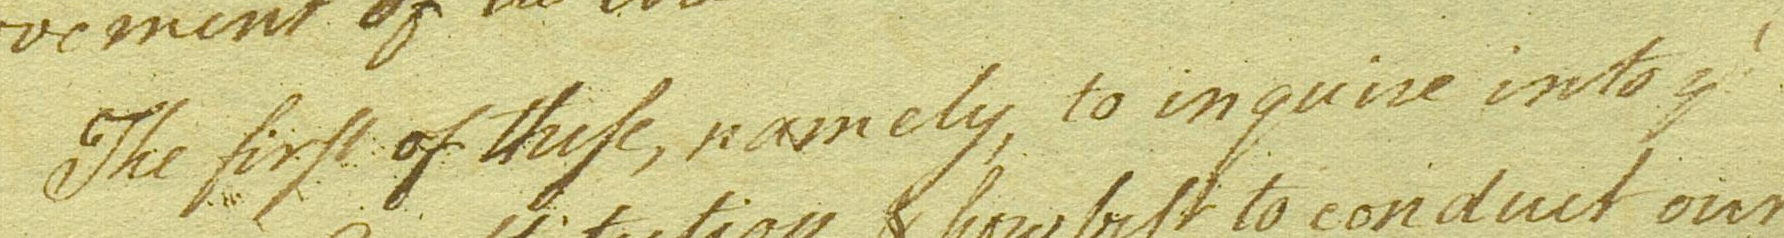The first of these, namely, to inquire into y^e
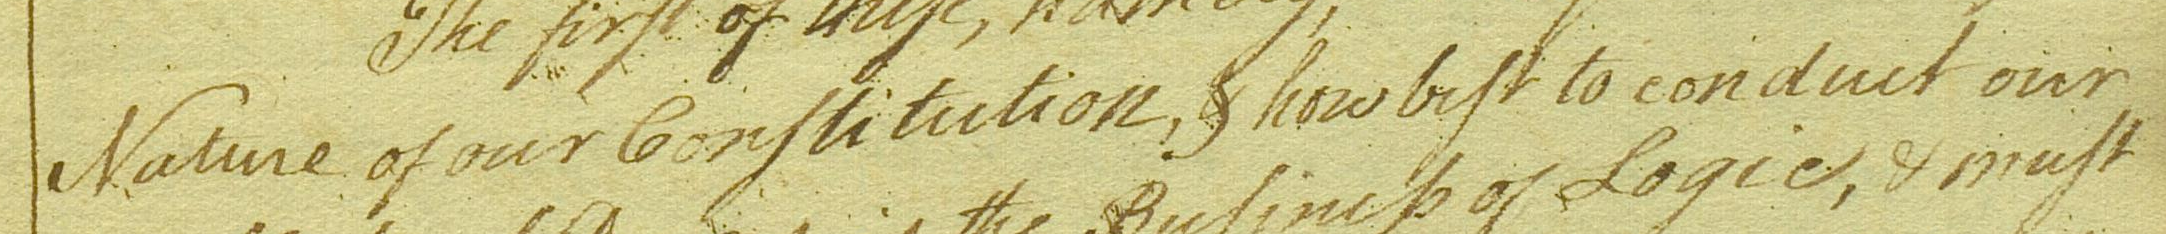Nature of our Constitution, & how best to conduct our
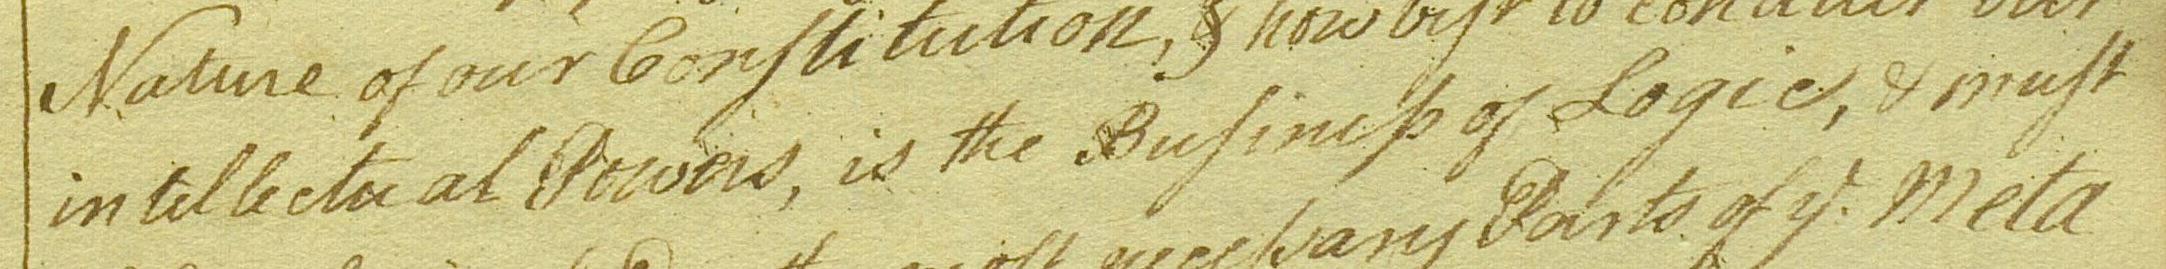intellectual Powers, is the Business of Logic, & must
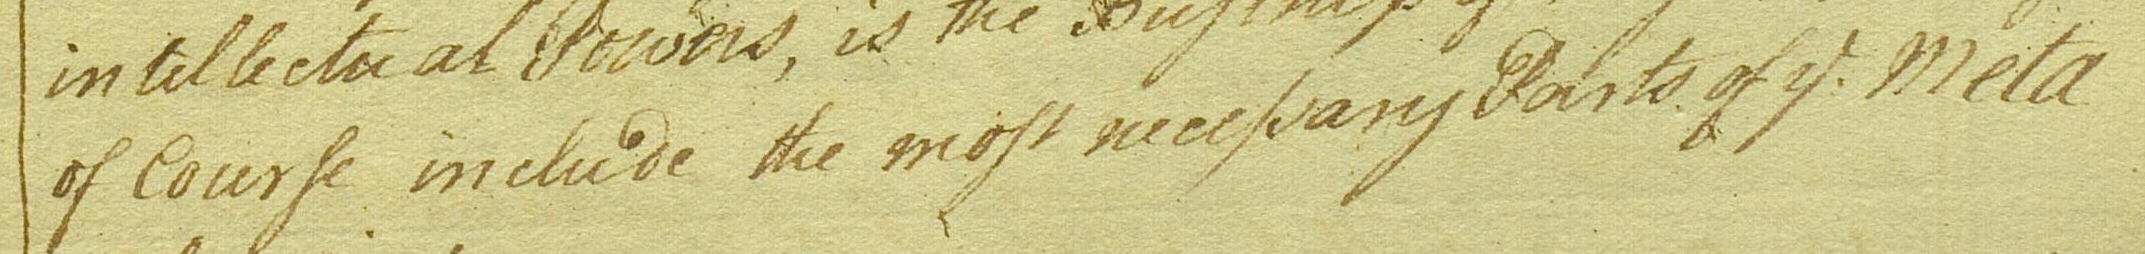of Course include the most necessary Parts of y^e Meta
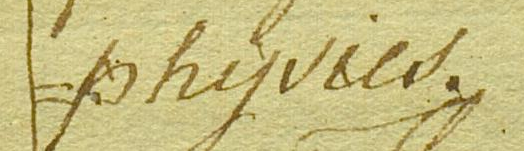-physics.
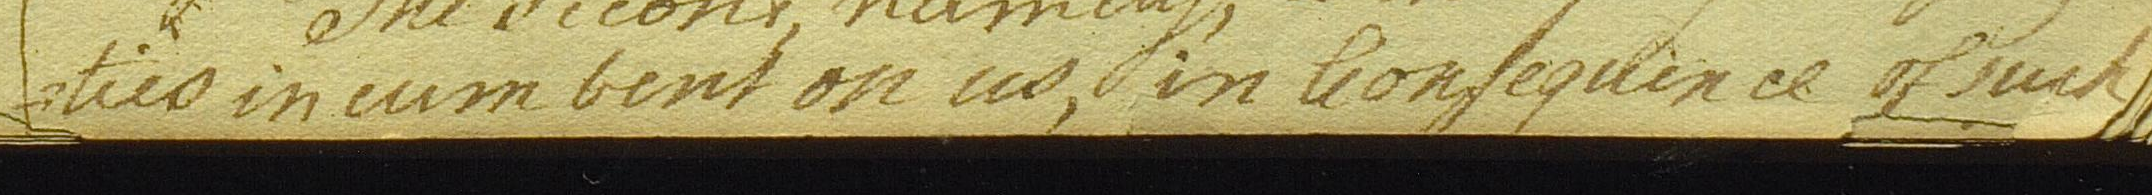-ties incumbent on us, in Consequence of such
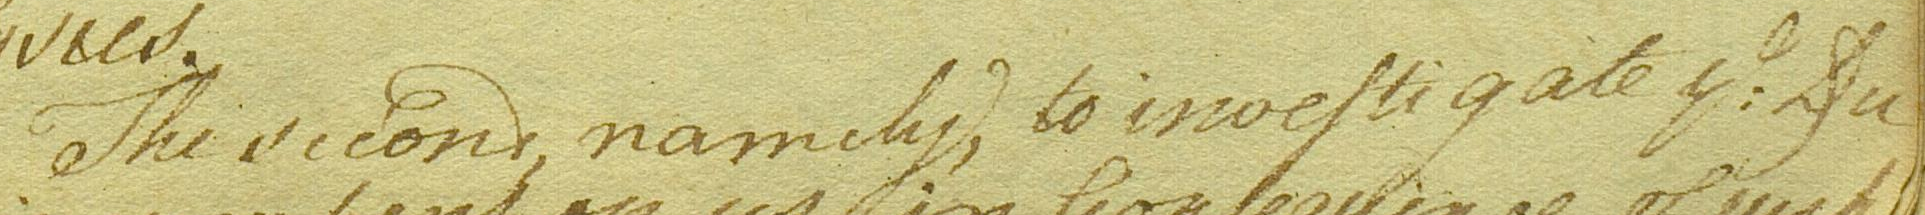The Second, namely, to investage y^e. Du-
